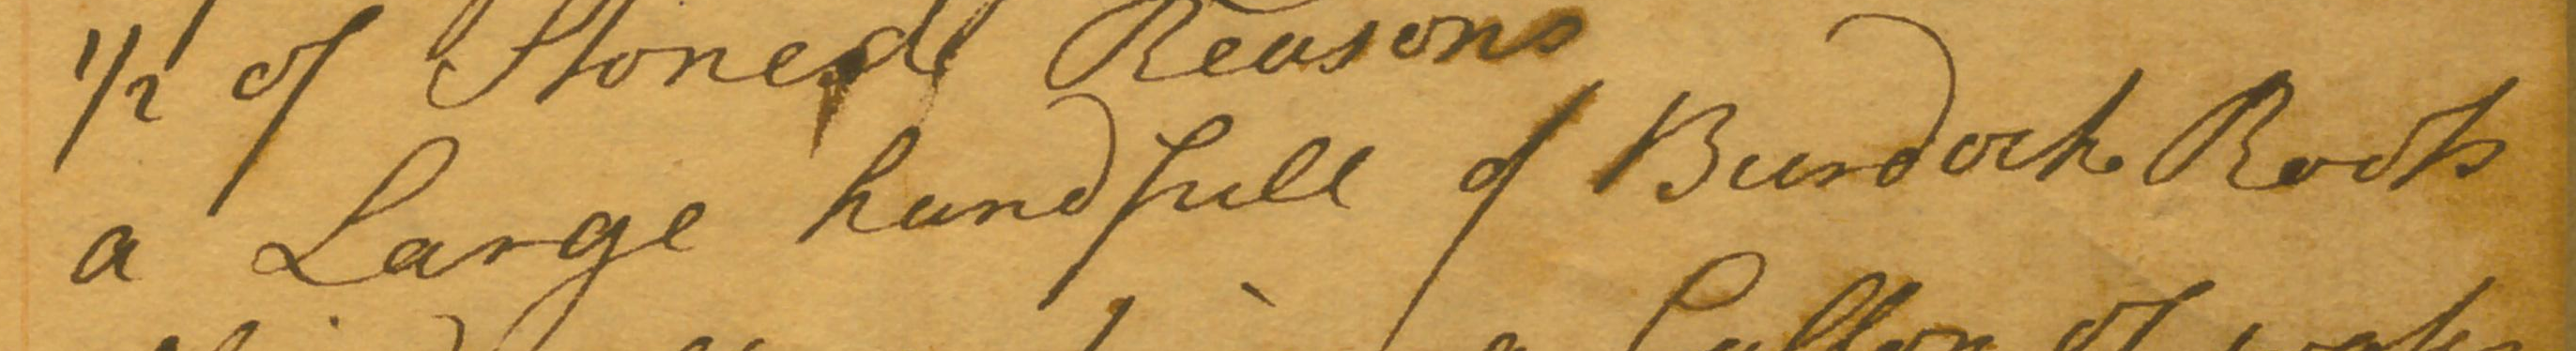a Large handfull of Burdock Roots
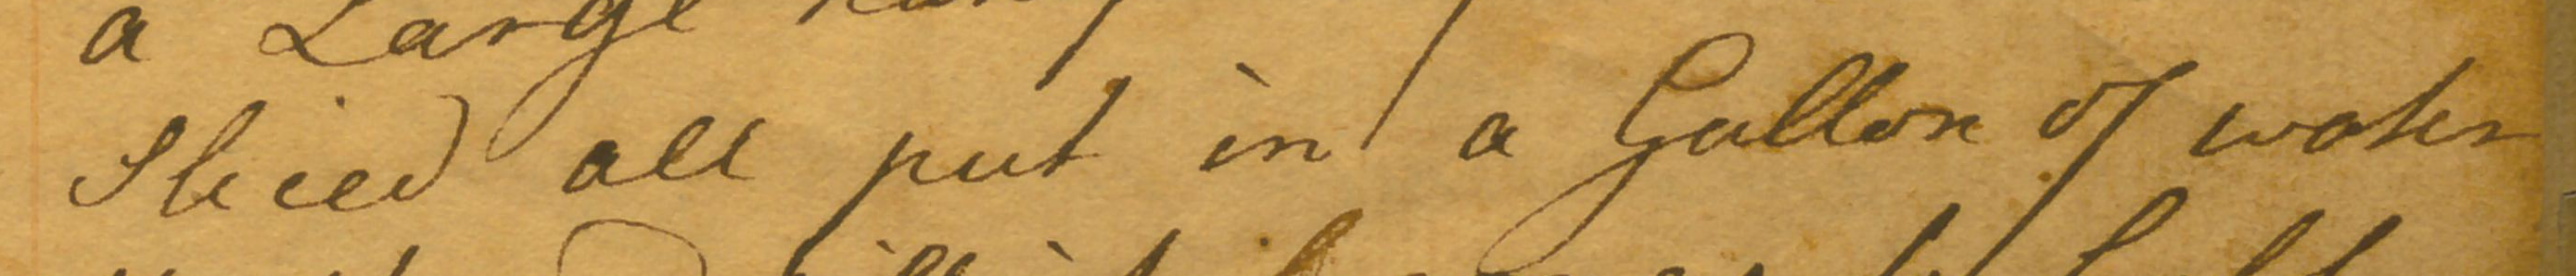sliced all put in a Gallon of water
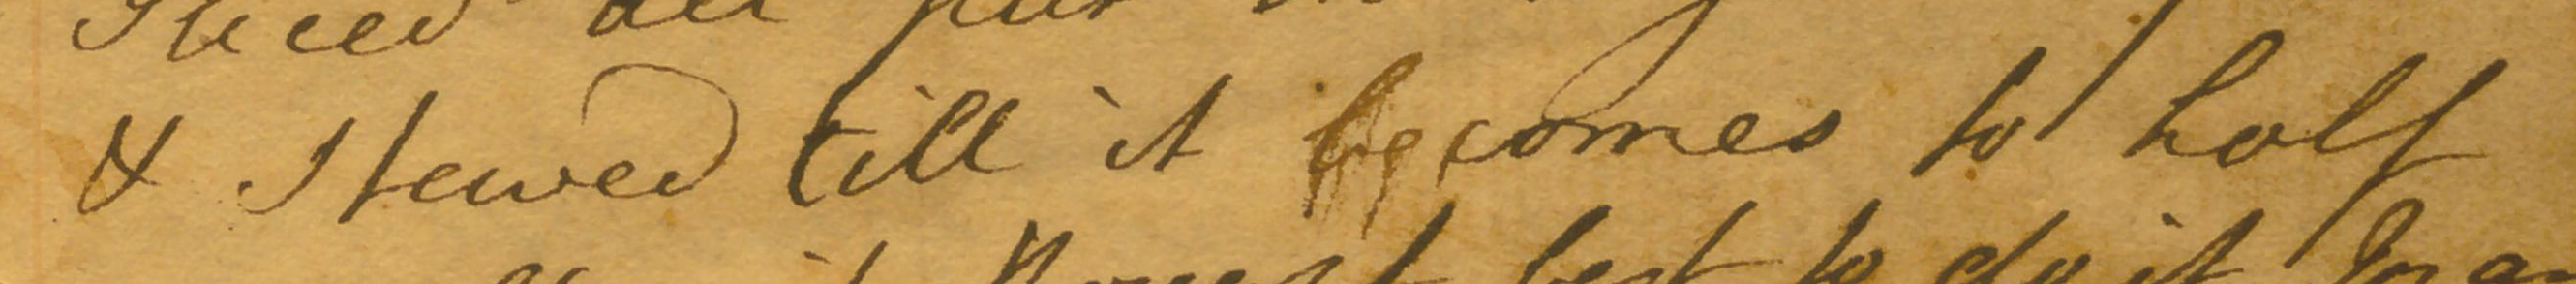& stewed till it becomes to half
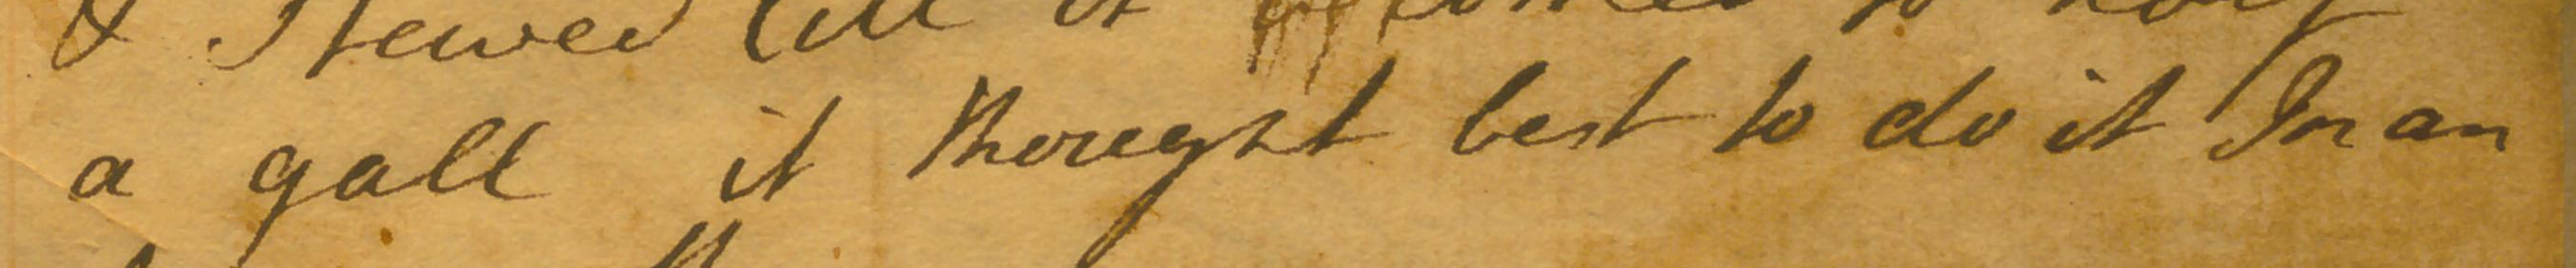a gall it thought best to do it In an
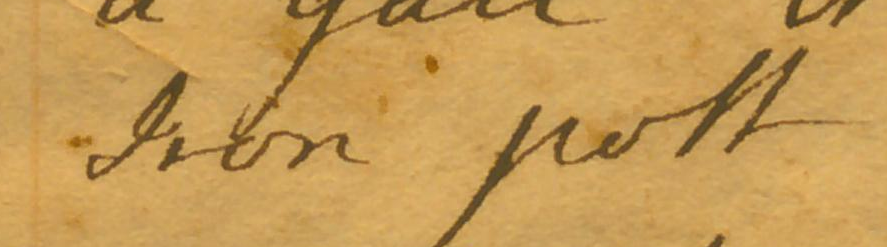Iron pott
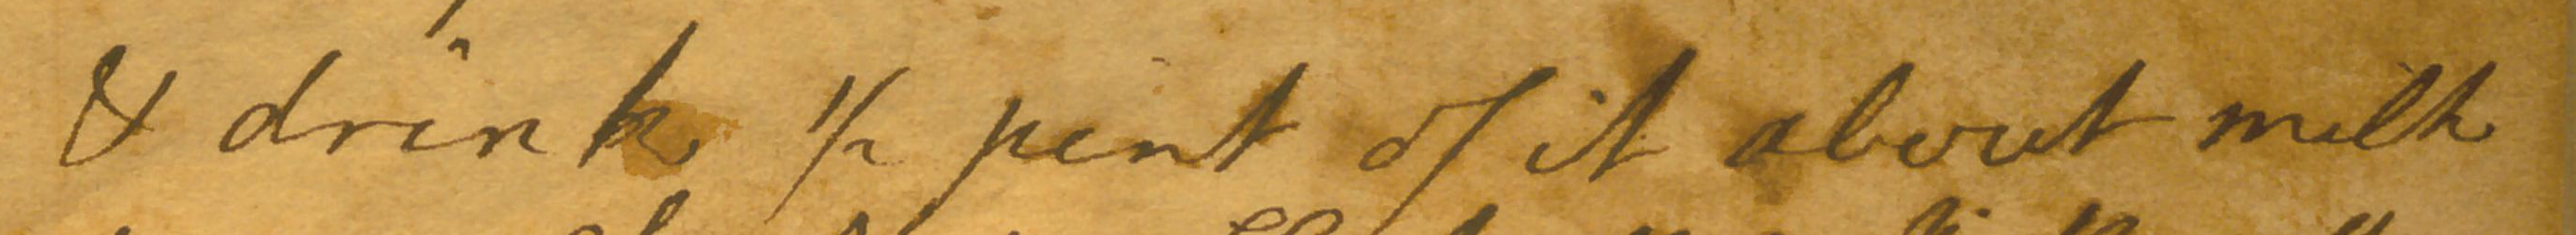& drink 1/2 pent of it about milk
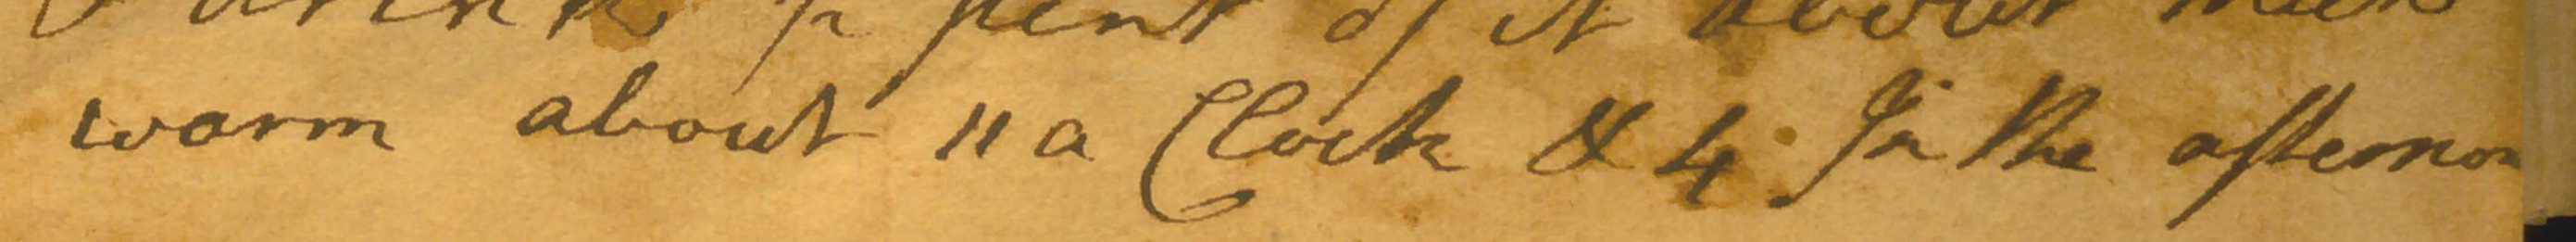warm about 11 a Clock & 4 In the afternoon
